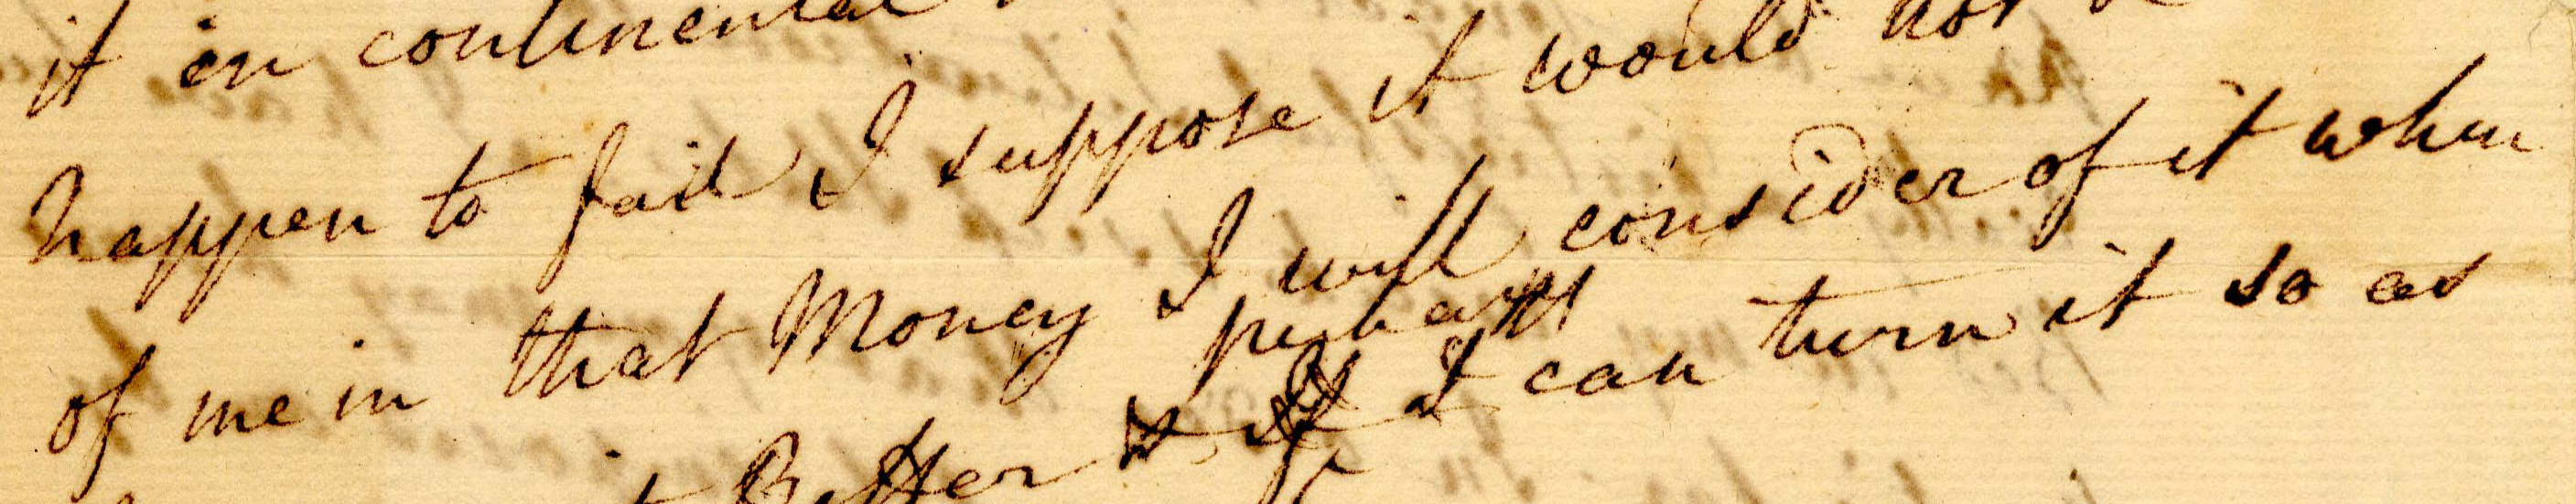of me in that Money I will consider of it where
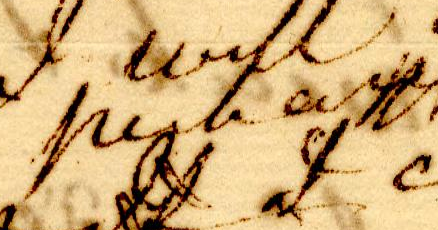purchase
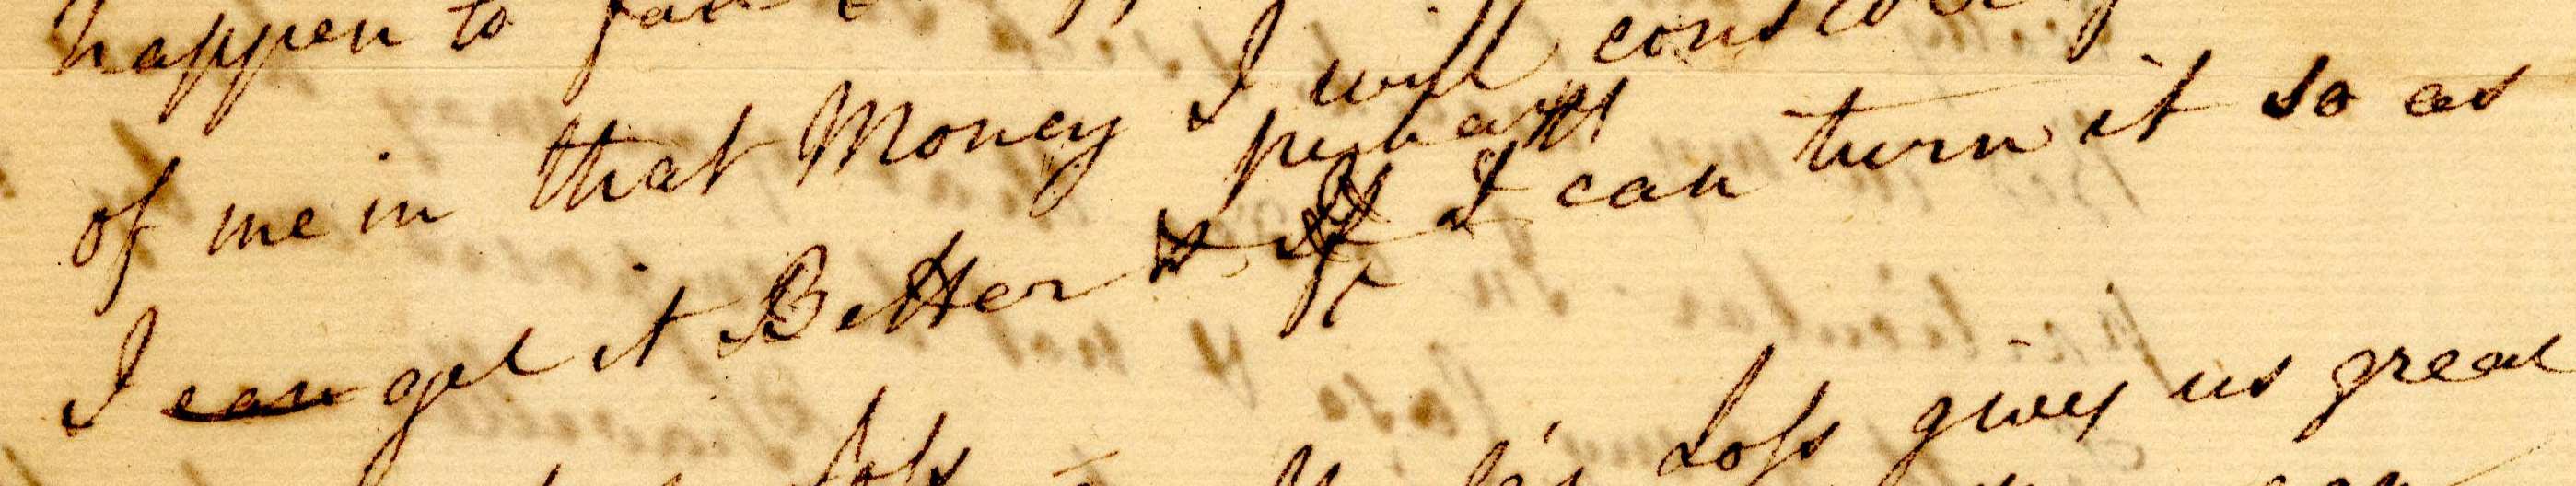I can get it Better & ^ if it can turn it so as
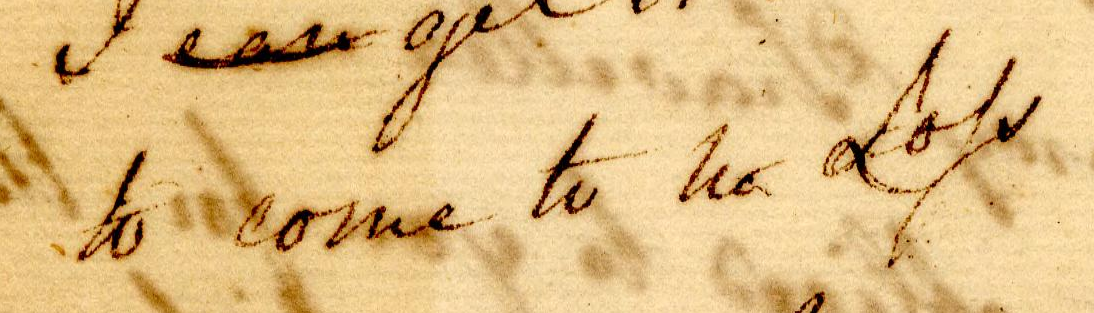to come to no Loss
